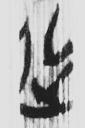{化止}（過）
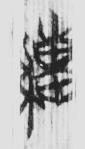{糸屮畕}（申）
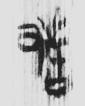暑（煮）
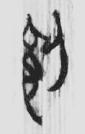飤（食）
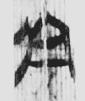於
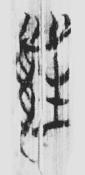鼪
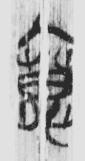○（蒐）
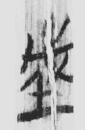城（成）
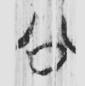公
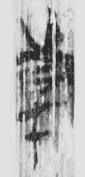○（乾）
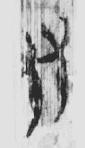○（遇）
